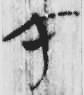午
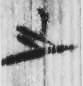之
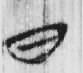日
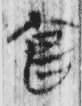宣
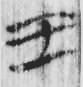王
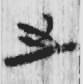之
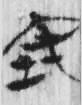○（坉）
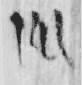州
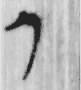人
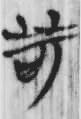苛
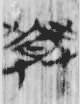登
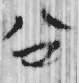公
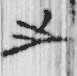之
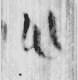州
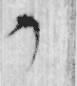人
